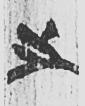之
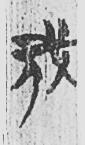戍
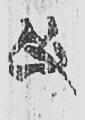及
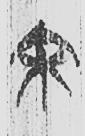宋
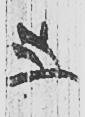之
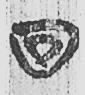回
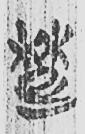楚
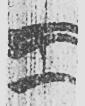王
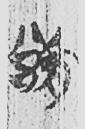豫
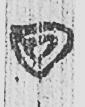回
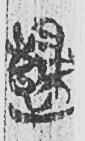歸
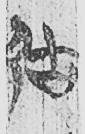居
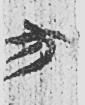方
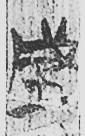城
